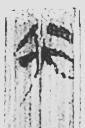內
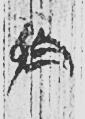於
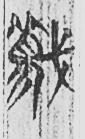蔑
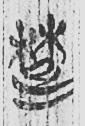楚
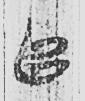𠂤
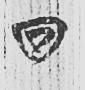回
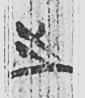之
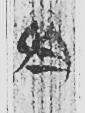於
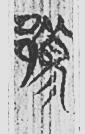{邑蔑}
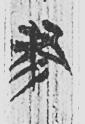𦘔
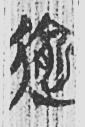逾
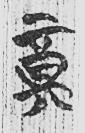奠
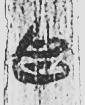𠂤
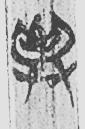與
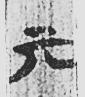亓
